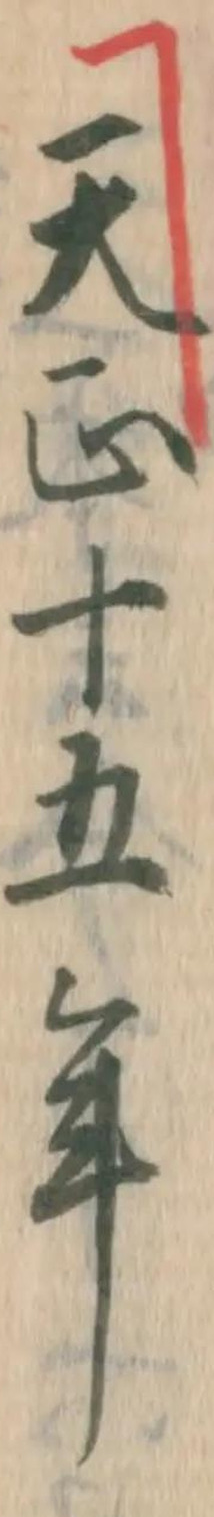天正十五年
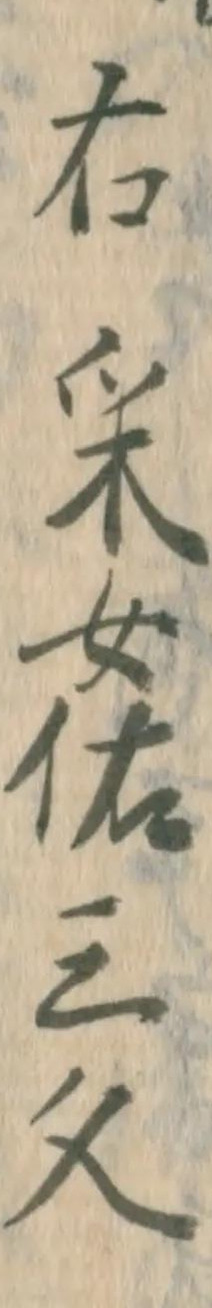右采女佑三久
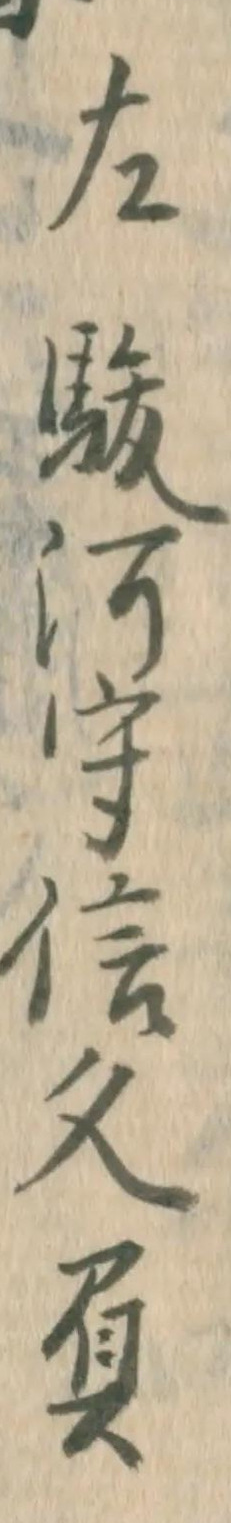左駿河守信父負
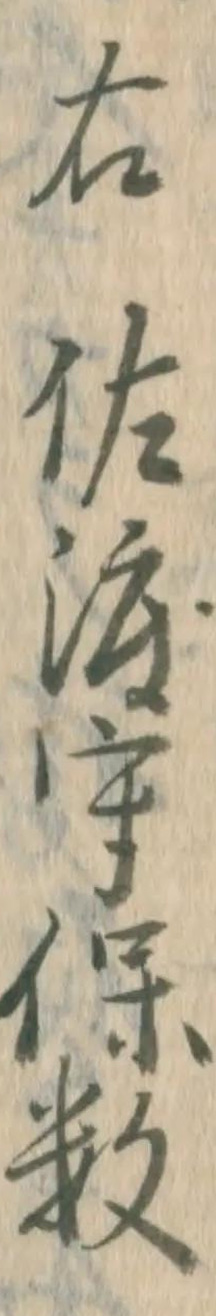右佐渡守保数
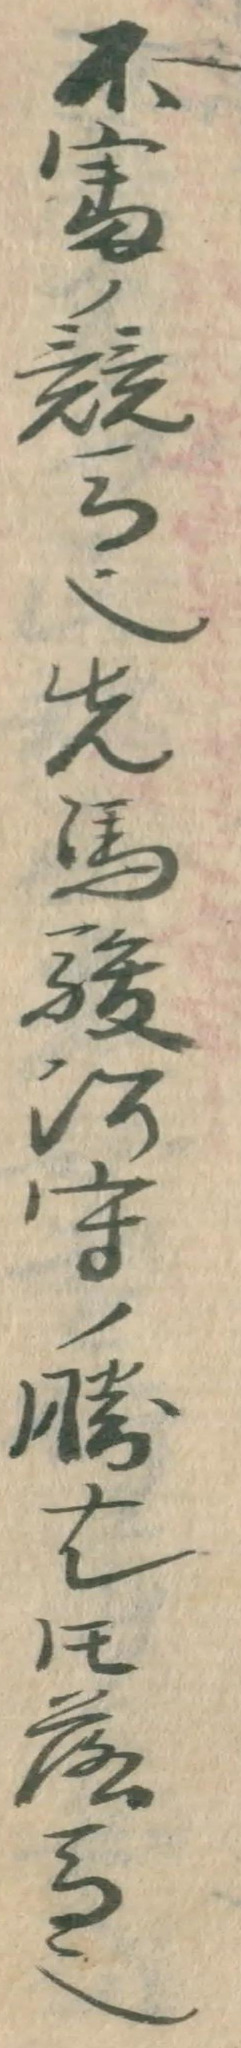不審ノ競馬也先馬駿河守ノ勝ナレトモ落馬也
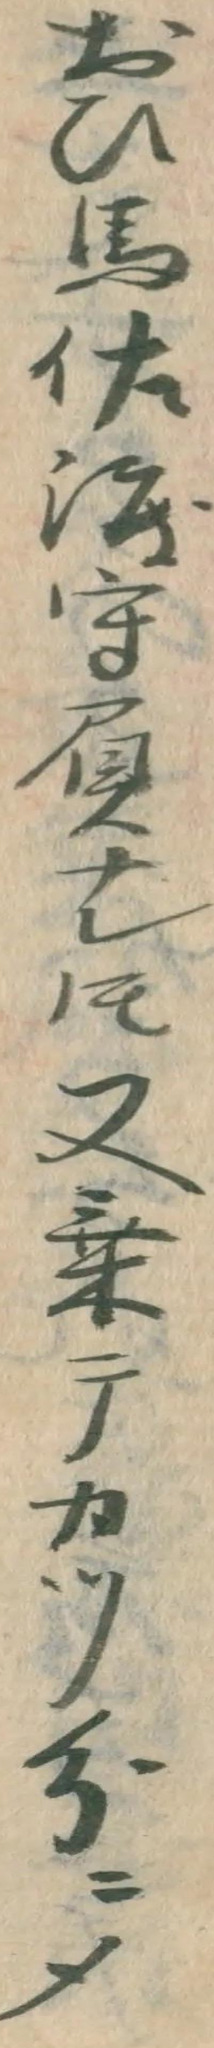おひ馬佐渡守負ナレトモ又乗テカツ分ニシテ

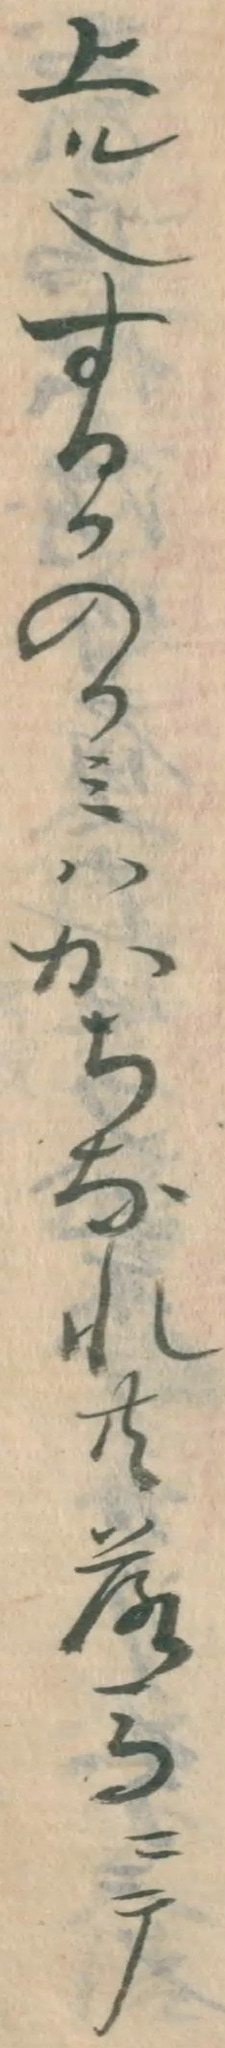上ル也するかのかみハかちなれ共落馬ニテ
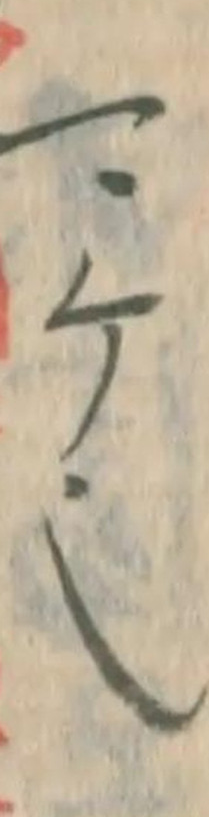マケ也
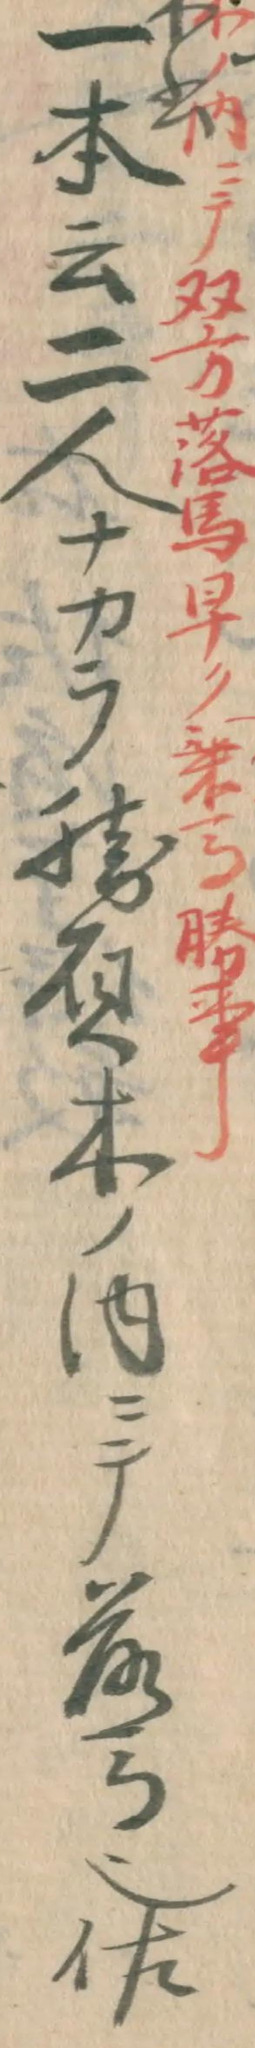一本云二人ナカラ勝負木ノ内ニテ落馬也佐
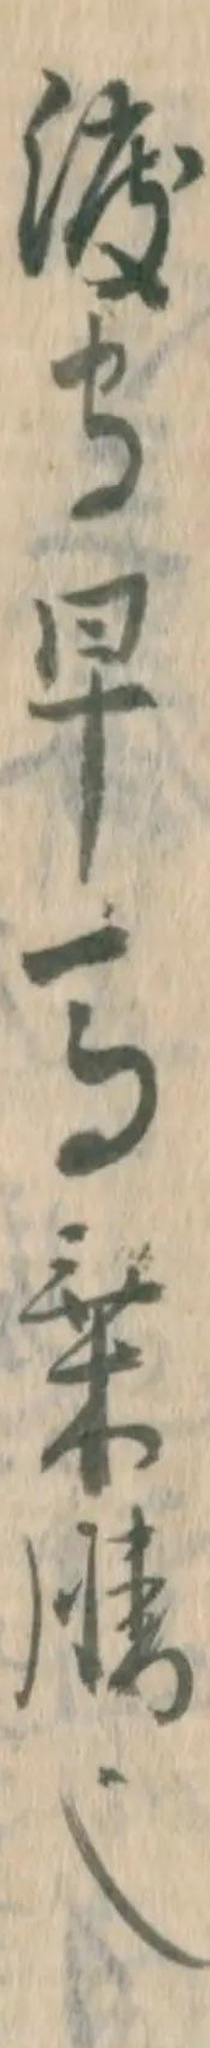渡守早馬乗勝也
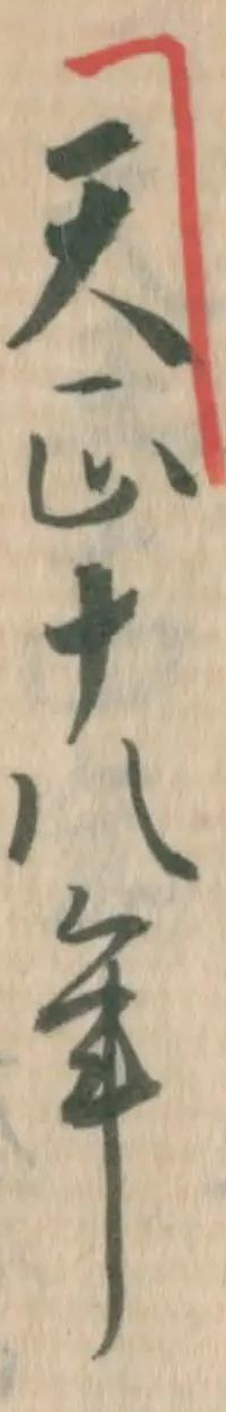天正十八年
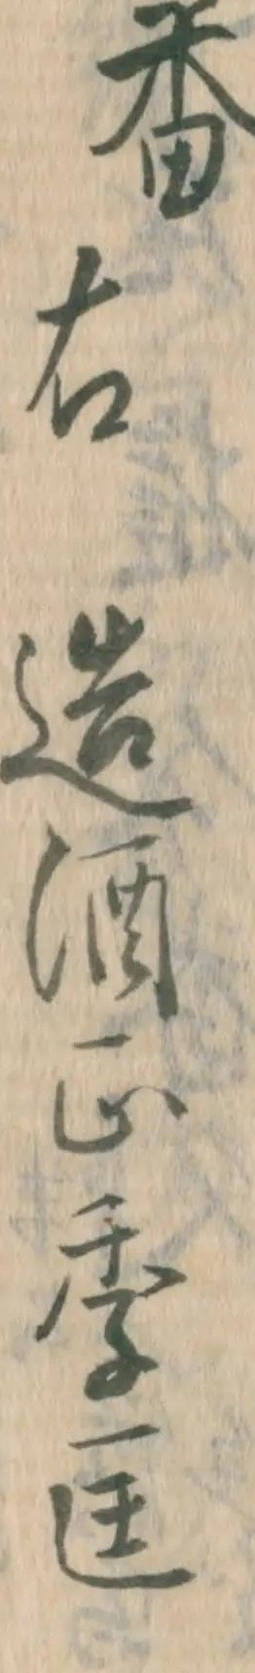右造酒正季匡
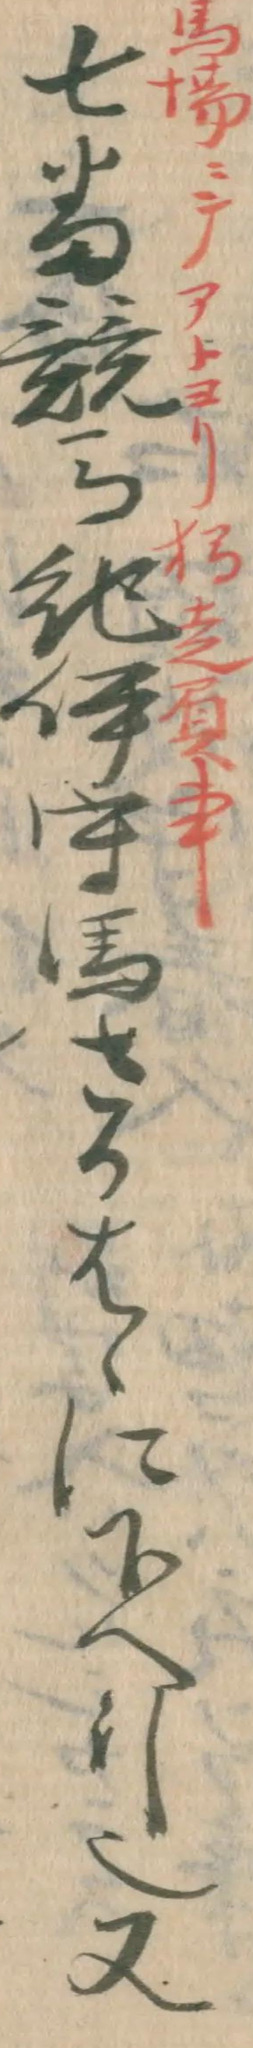七番競馬紀伊守馬さかはゝに下へ引也又
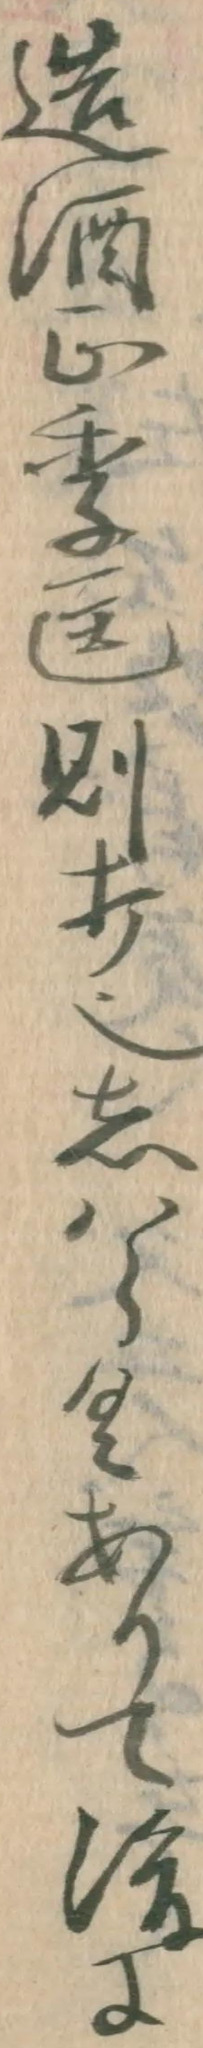造酒正季匡則打也しはらくありて後に
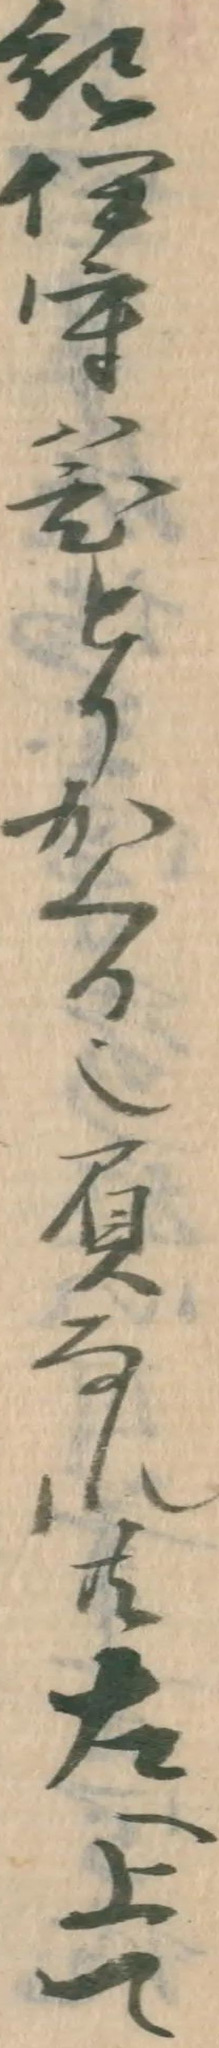紀伊守ハひとりかくる也負なれ共左へ上て
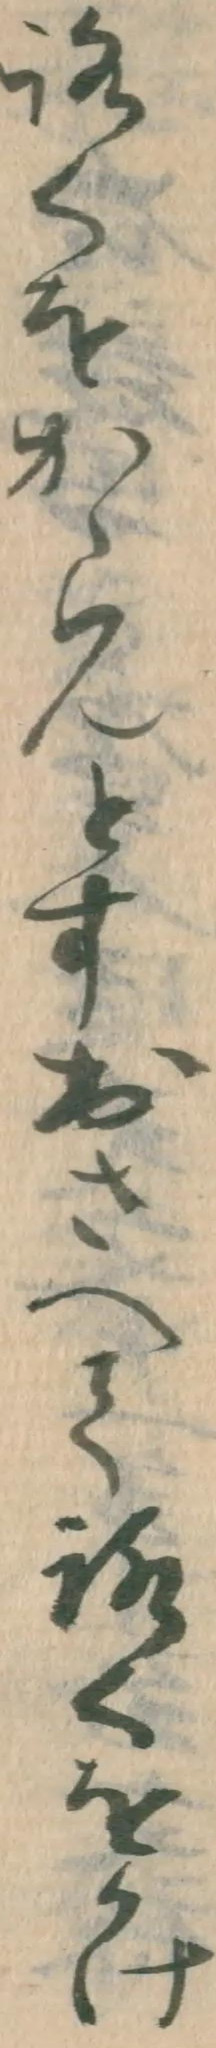ろくをからんとすおさへてろくをかけ
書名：賀茂社記録. 第10冊
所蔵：国立国会図書館 National Diet Library, JAPAN
